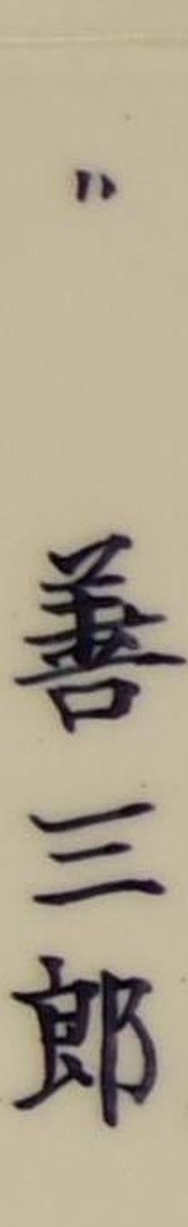善三郎
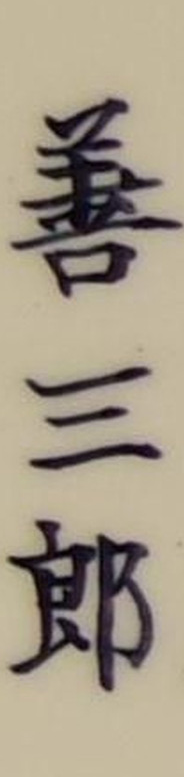善三郎

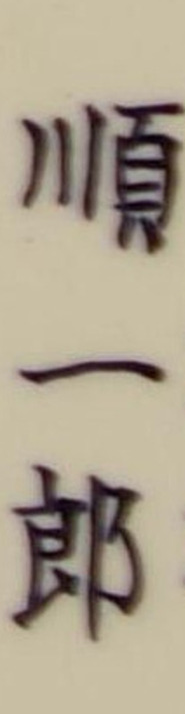順一郎
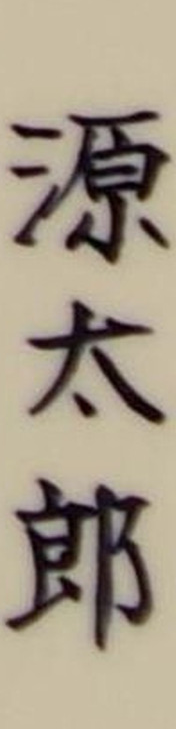源太郎
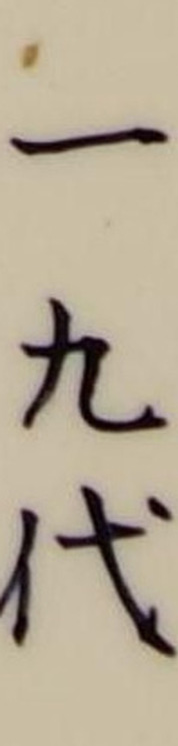一九代
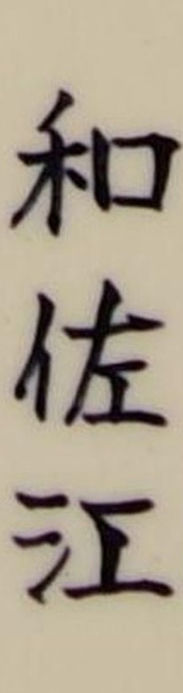和佐江
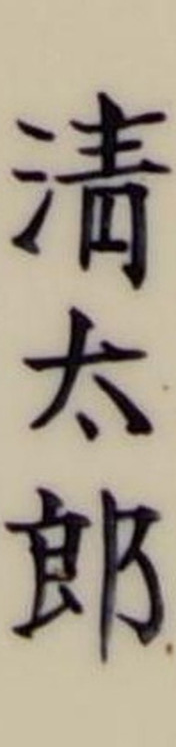清太郎
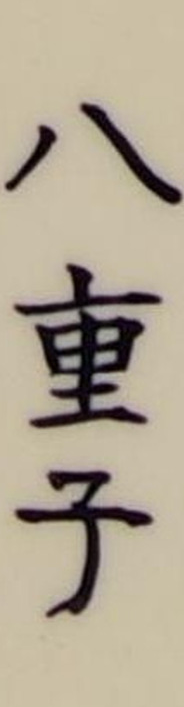八重子
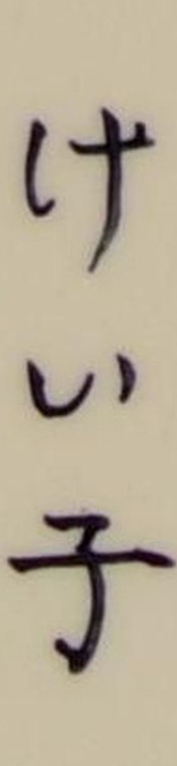けい子
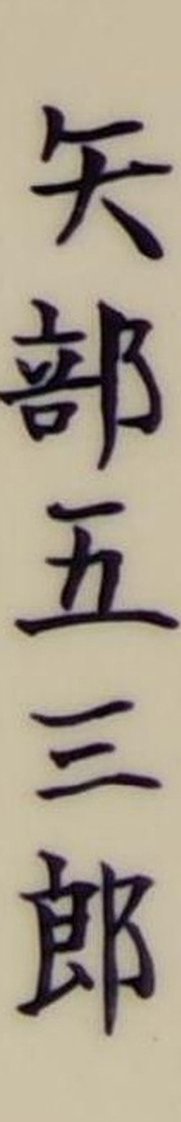矢部五三郎
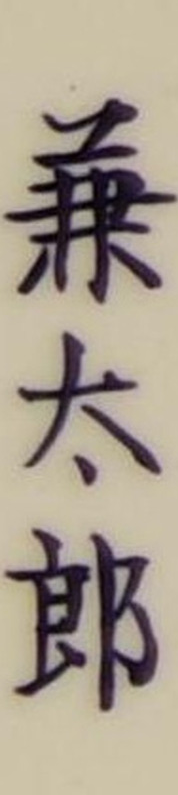兼太郎
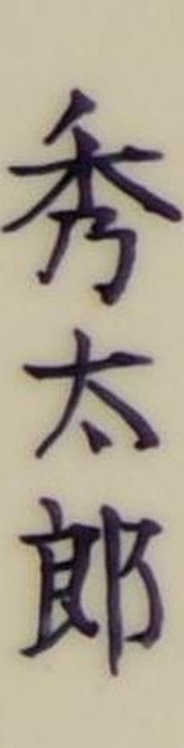秀太郎

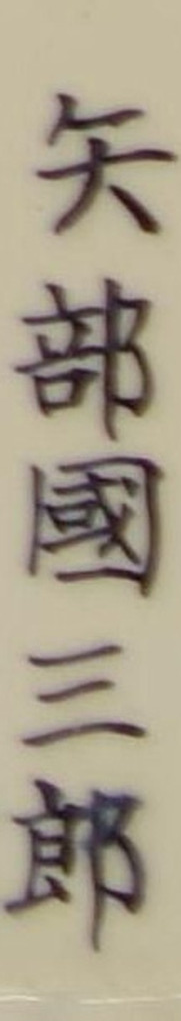矢部国三郎
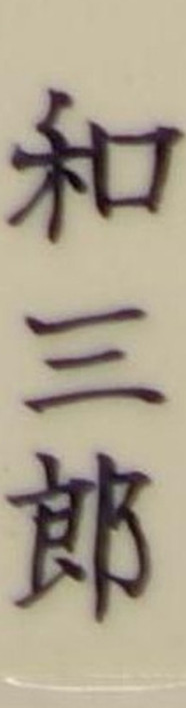和三郎
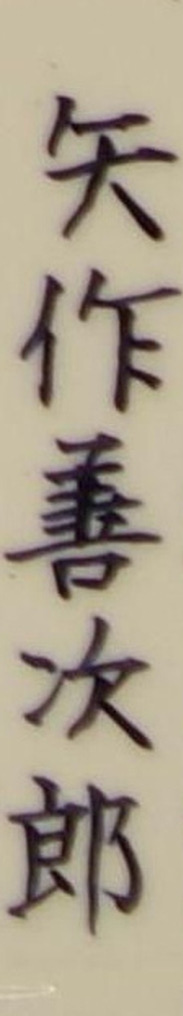矢作善次郎
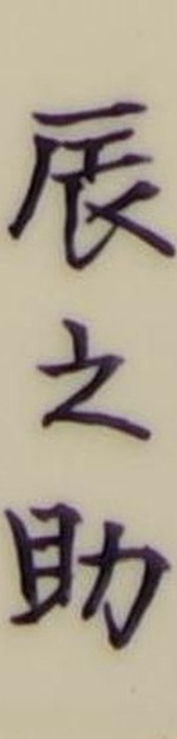辰之助
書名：A~D
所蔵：koyasan kongobuji
